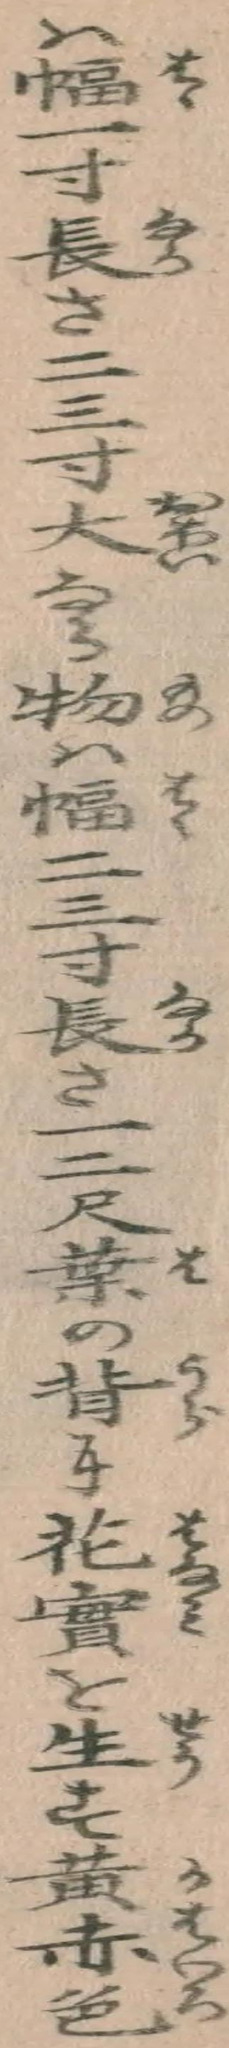は幅一寸長さ二三寸大なる物は幅二三寸長さ一二尺葉の背に花実を生す黄赤色
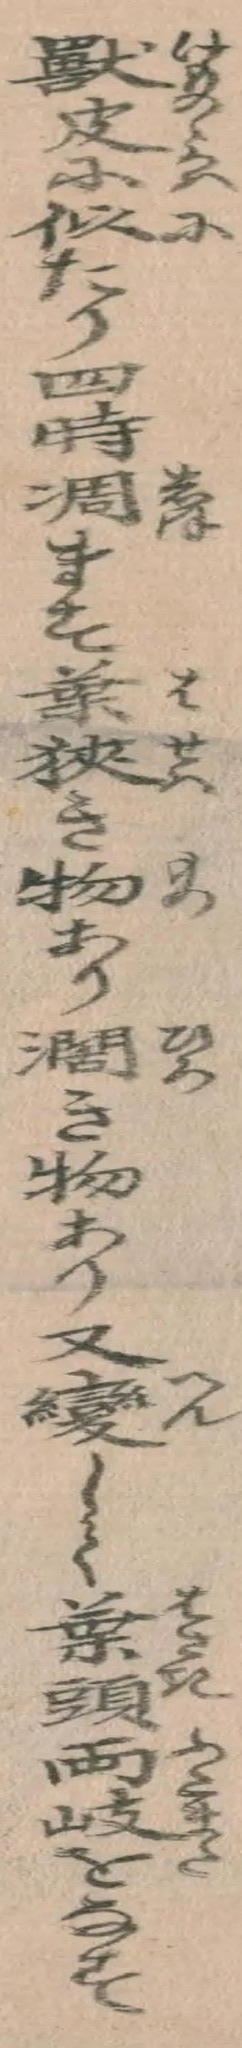獣皮に似たり四時凋ます葉狹き物あり闊き物あり又変して葉頭両岐をなす
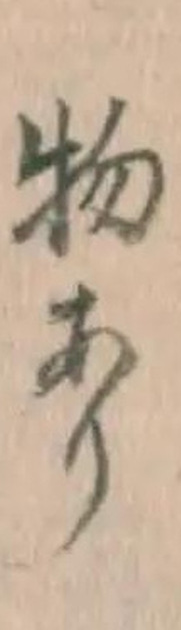物あり

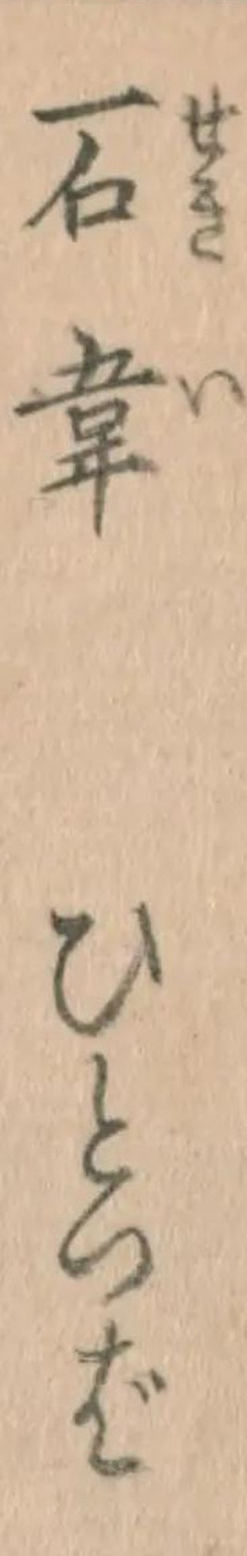石韋ひとつば
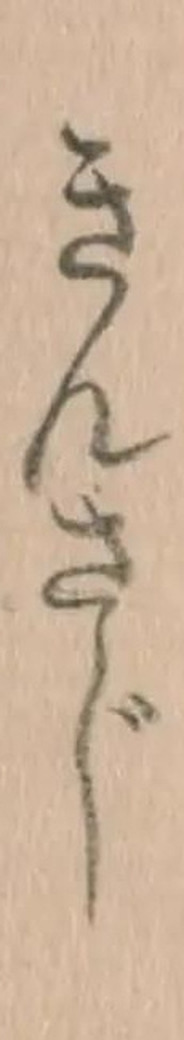きんさじ
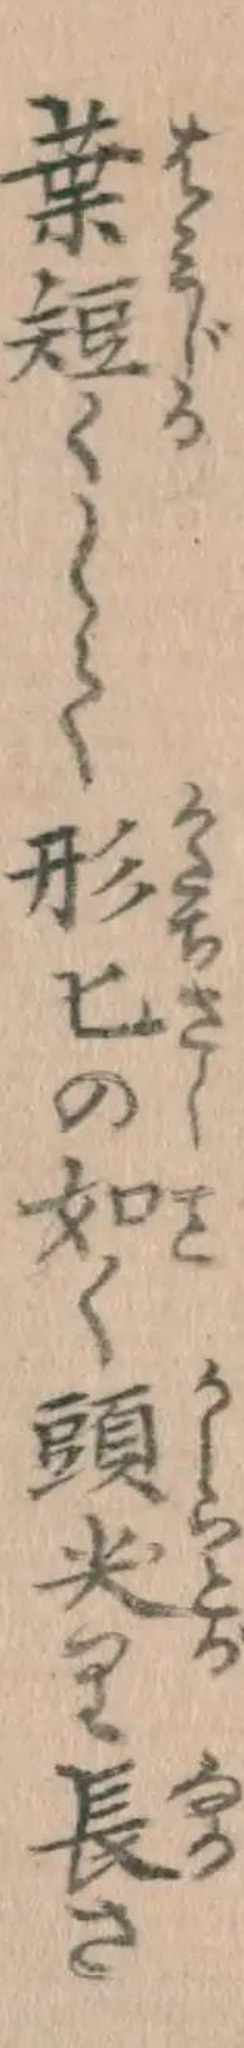葉短くして形匕の如く頭尖り長さ
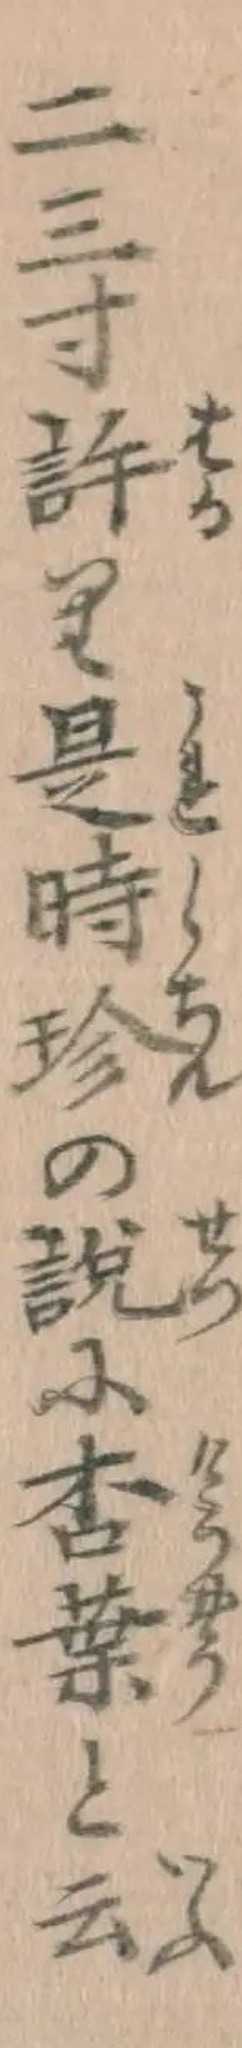二三寸許り是時珍の説に杏葉と云
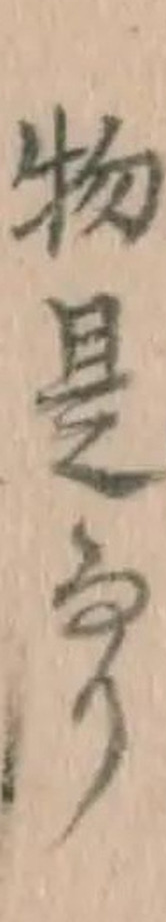物是なり
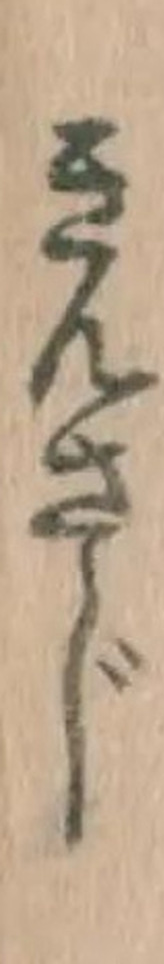きんさじ

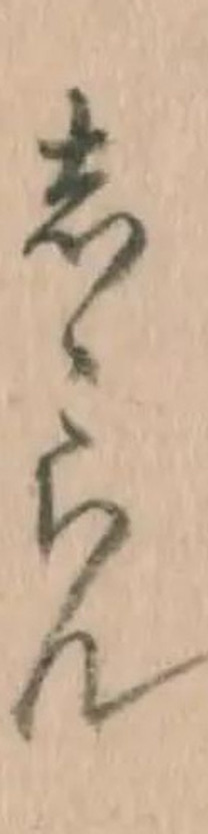しゝらん
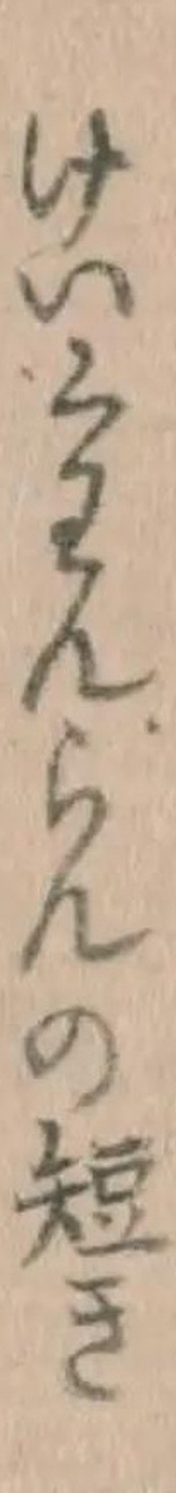けいくわんらんの短き
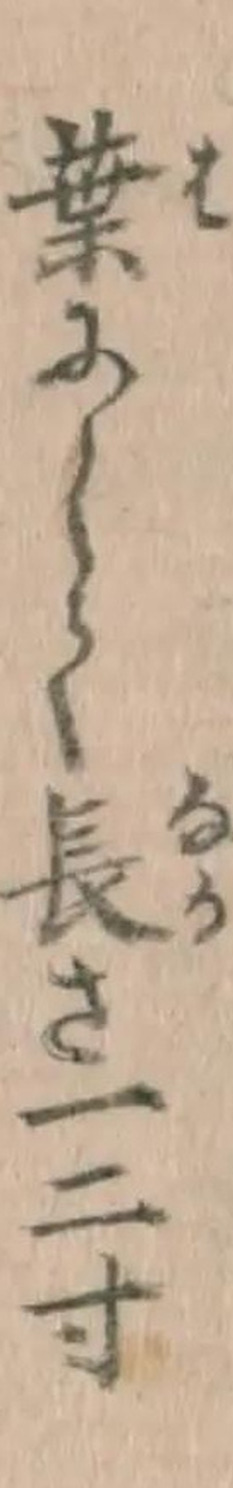葉にして長さ一二寸
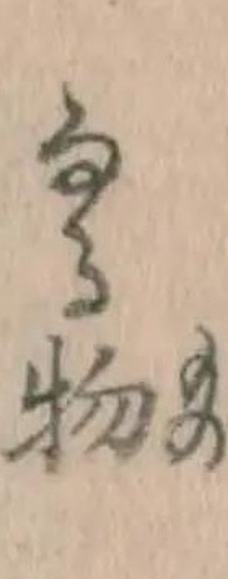なる物

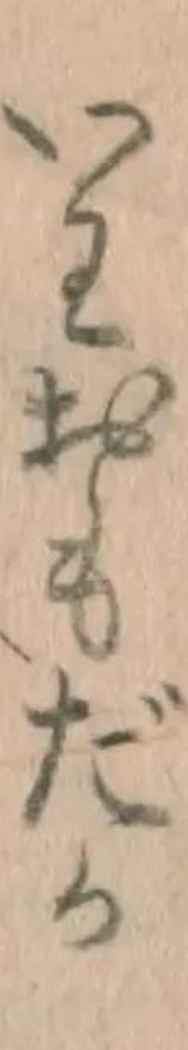いわおもだか
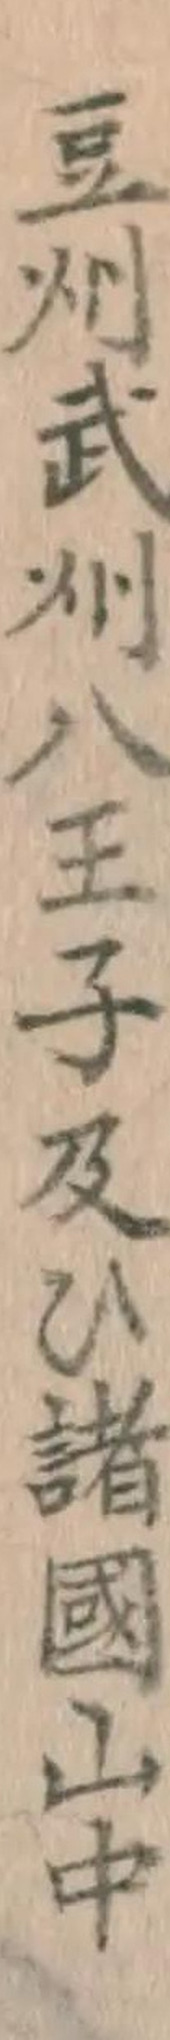豆州武州八王子及ひ諸国山中
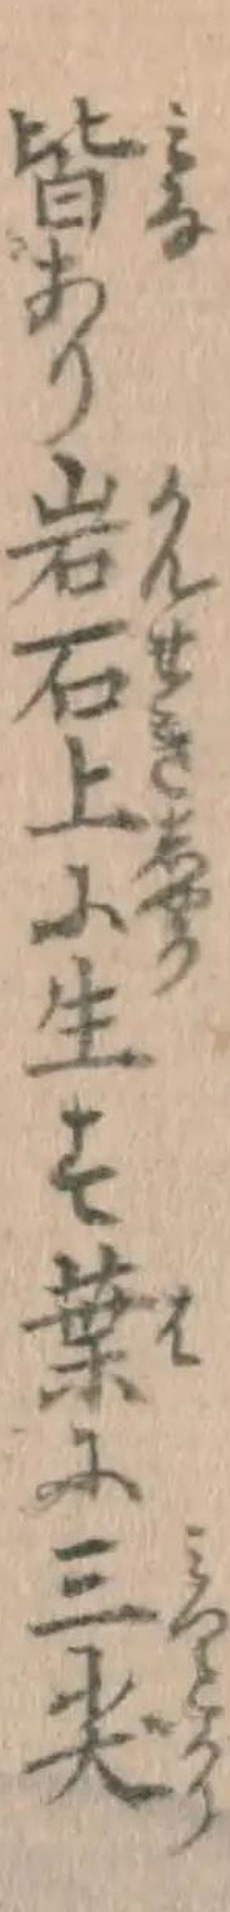皆あり岩石上に生す葉に三尖
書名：本草図譜. 巻34-36
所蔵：国立国会図書館 National Diet Library, JAPAN
